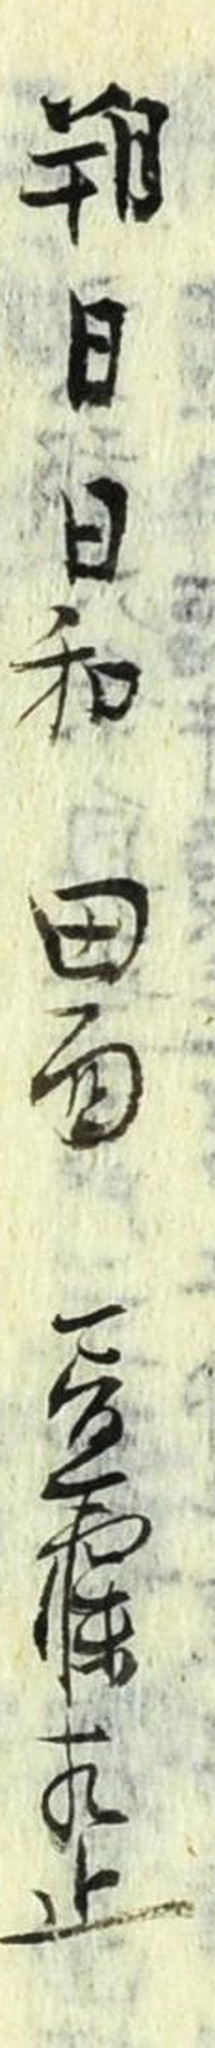朔日日和田面昼寐相止
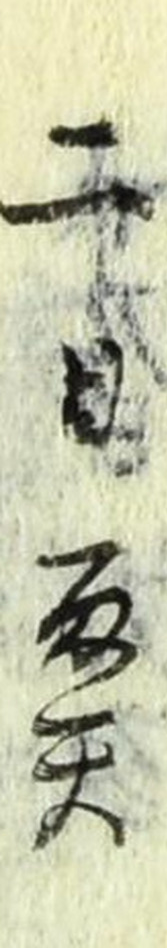二日雨天
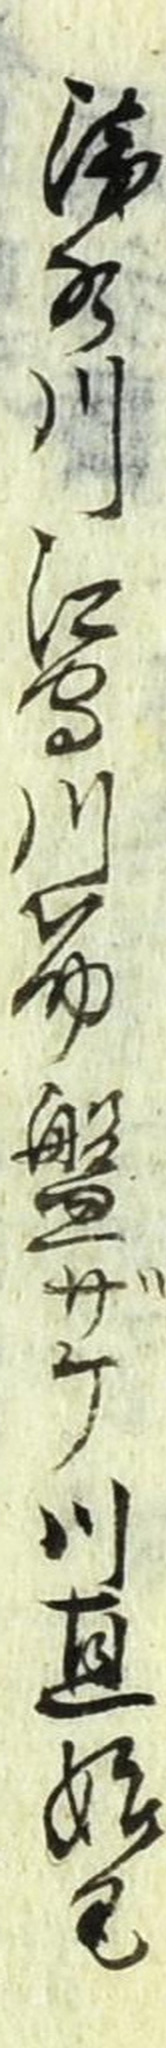浅水川江守川筋盤ザケ川直始由
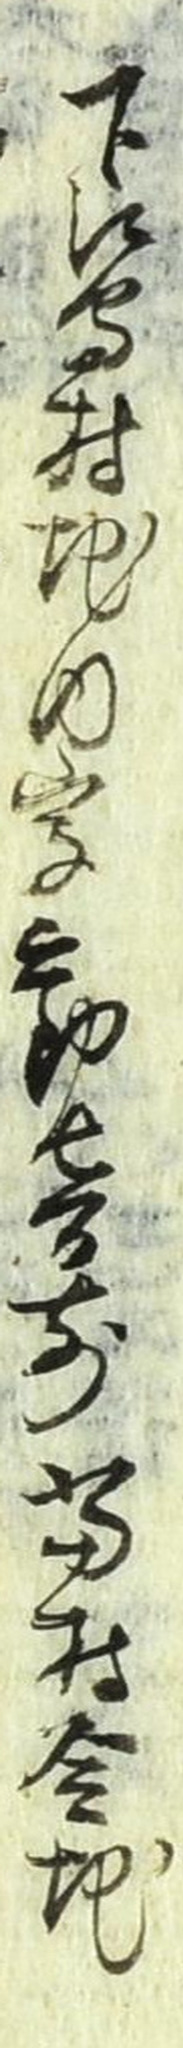下江守村地内字勧音前当村会地
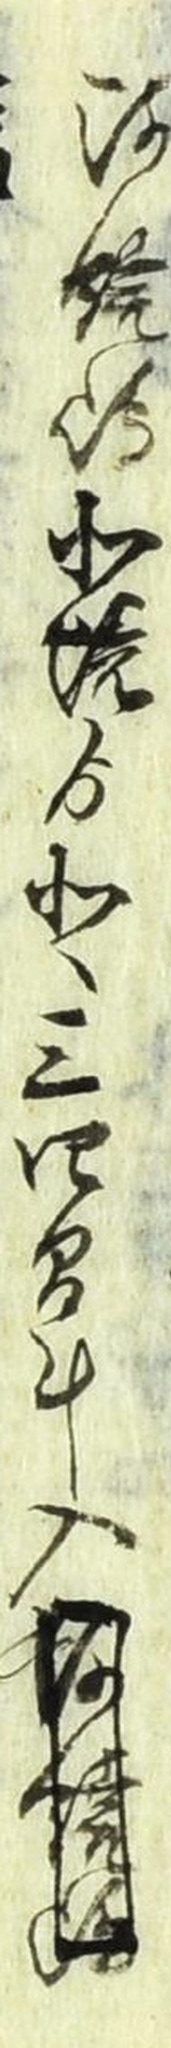河饒島北境ゟ北へ三四間計入「河饒島」
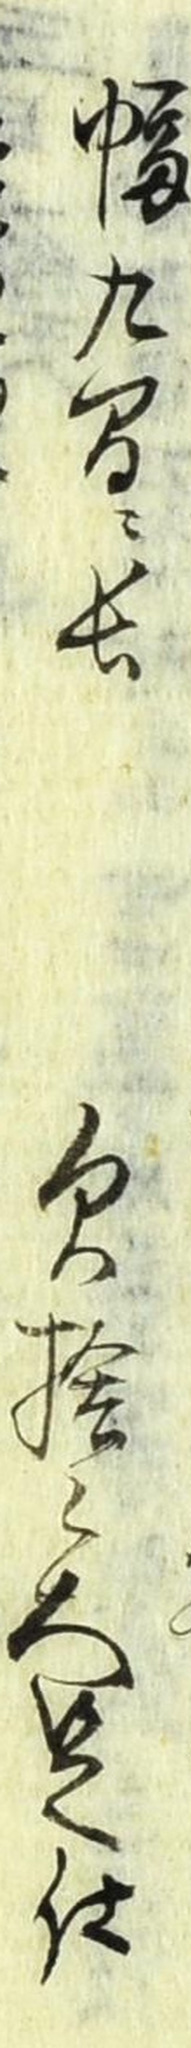幅九間に長欠捨候人足仕
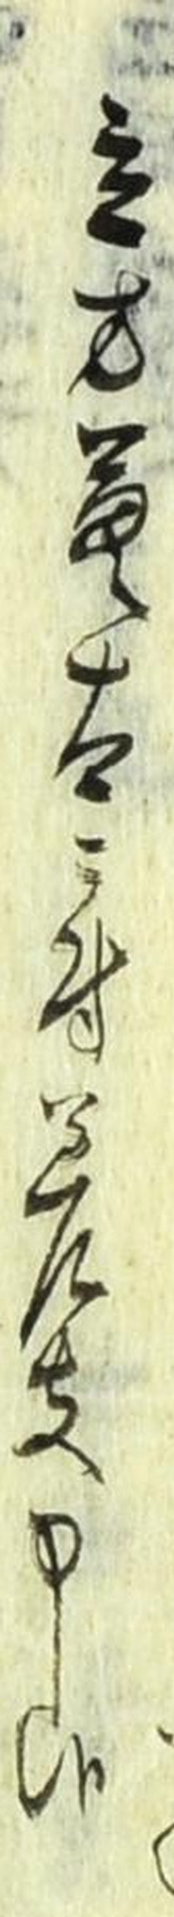立方番太に付差支申候
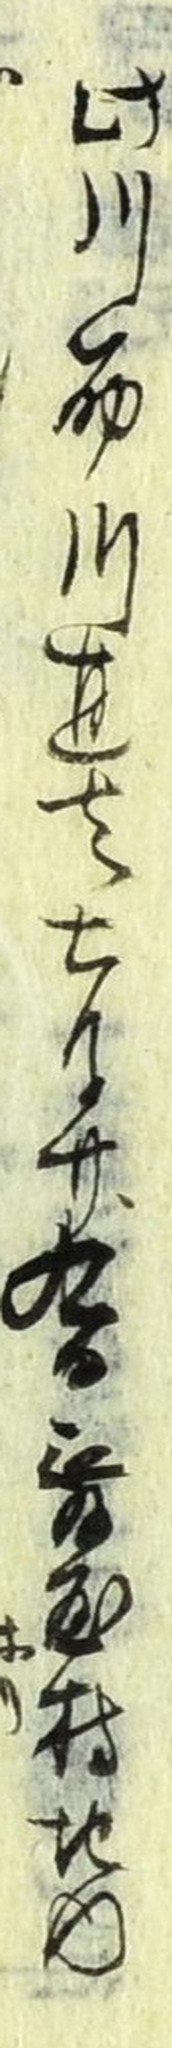此川筋川直は七月廿九日舞屋村地内
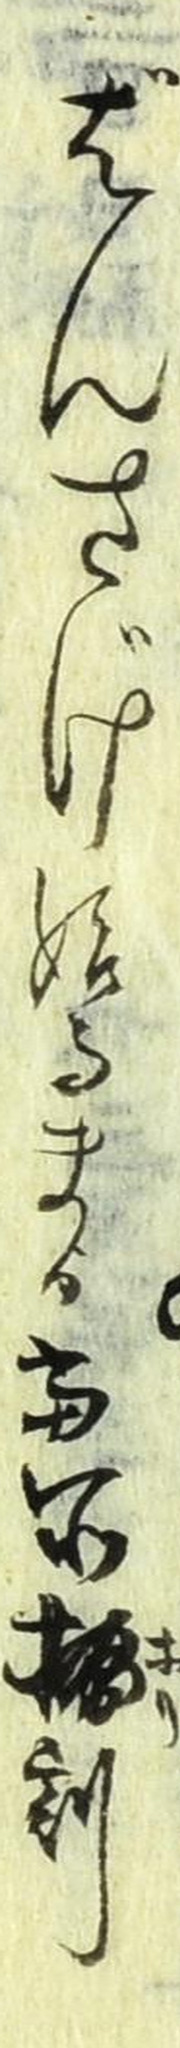ばんさげ始る夫ゟ当所堀割
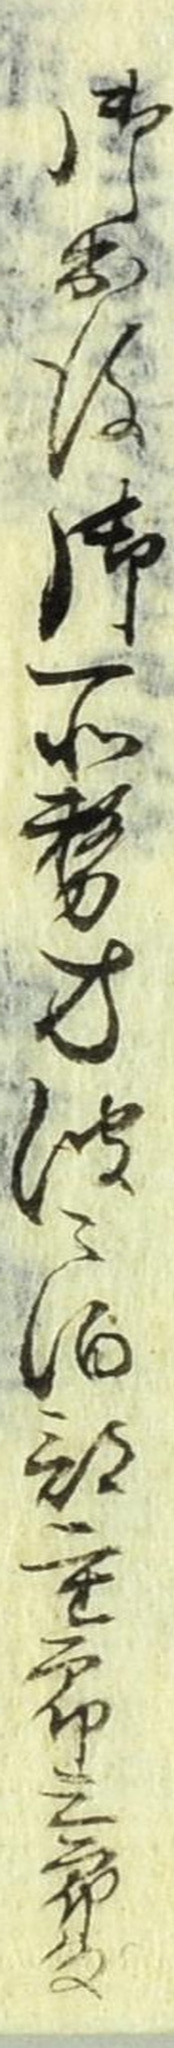御出役御所務方波々泊部重郎三郎殿
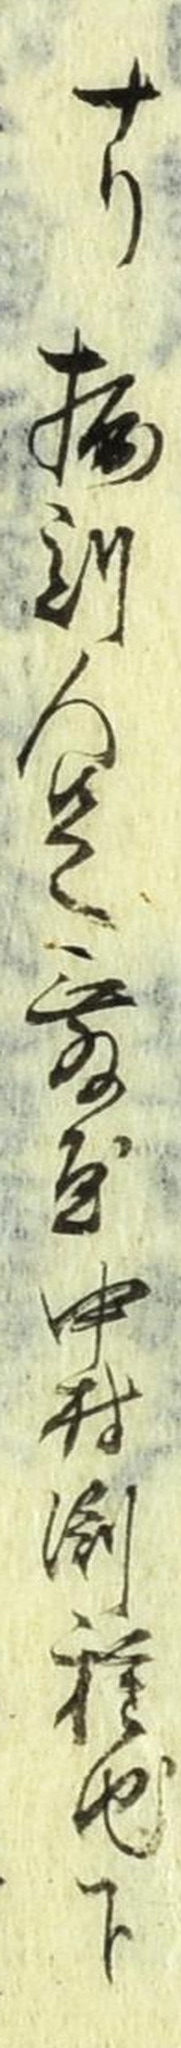なり堀割人足舞屋中村淵種池下
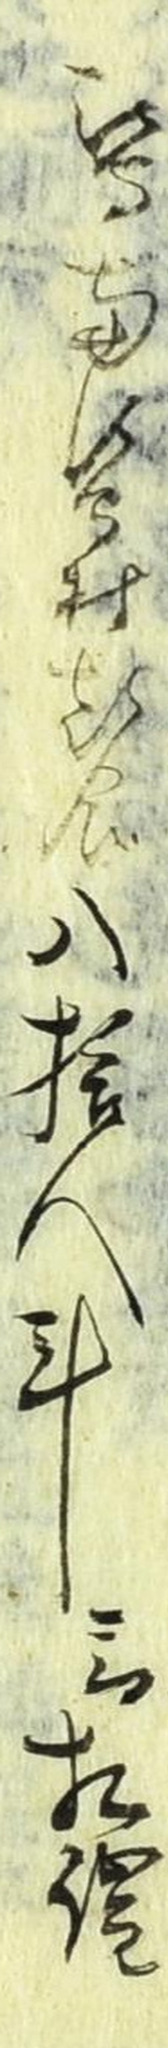江守南江守村都合八拾人計に而相催
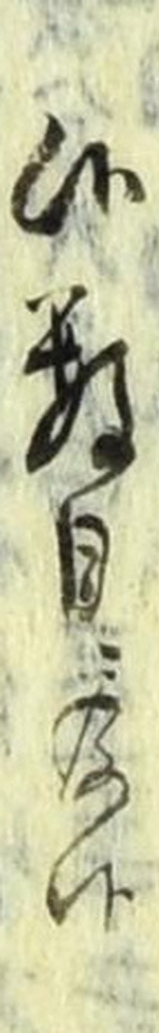候数日に及候
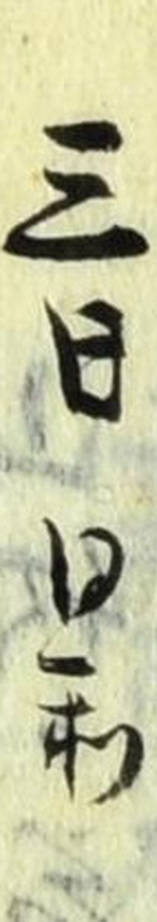三日日和
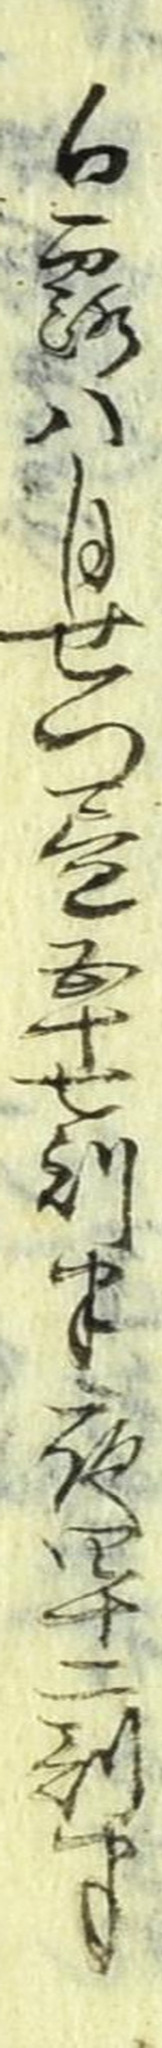白露八月せつ昼五十七刻半夜四十二刻半
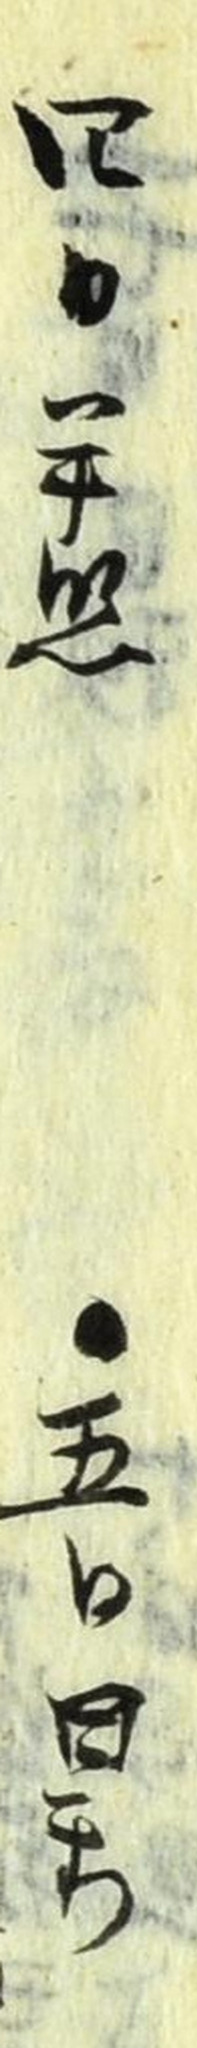四日半照●五日日和
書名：（日記）
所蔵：福井県文書館 Fukui Prefectural Archives
